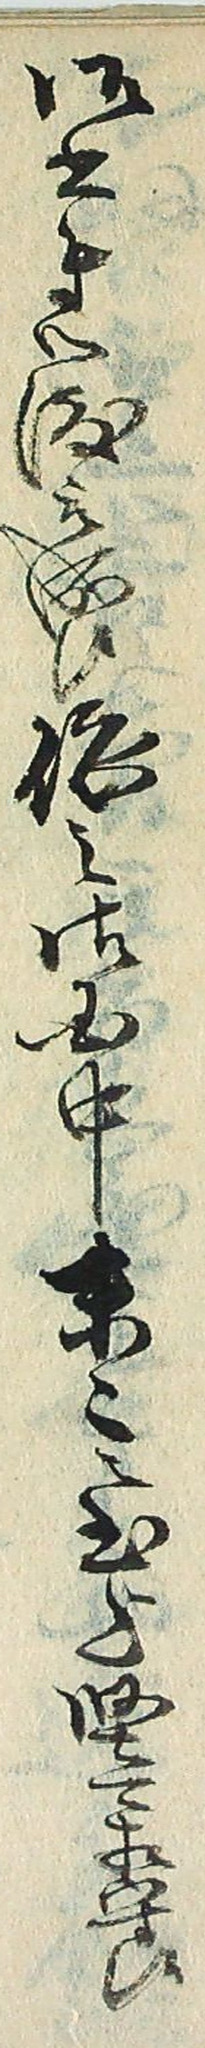御書付御渡被成候依之御国中末々に至迄堅可相守候
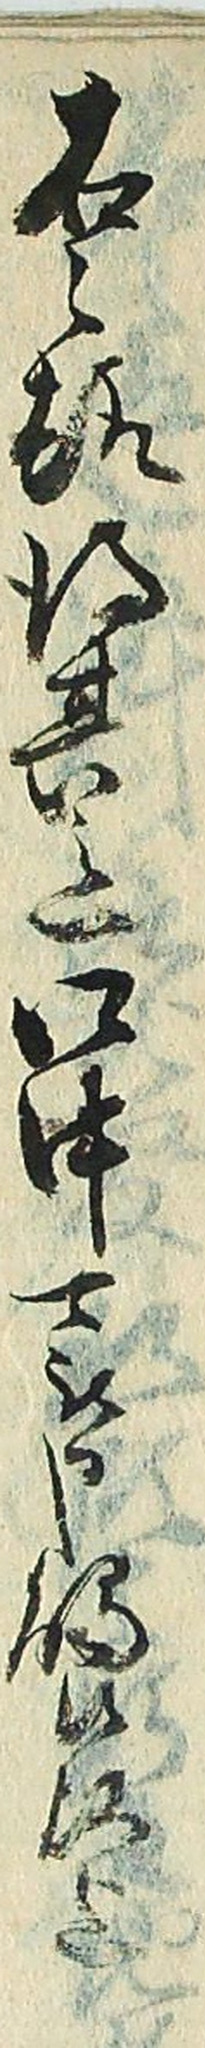右之趣得其意郷中可被申触候以上
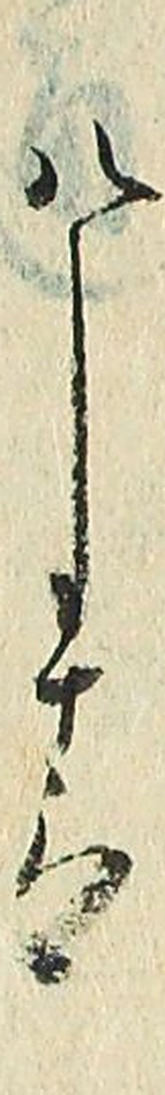八月十七日
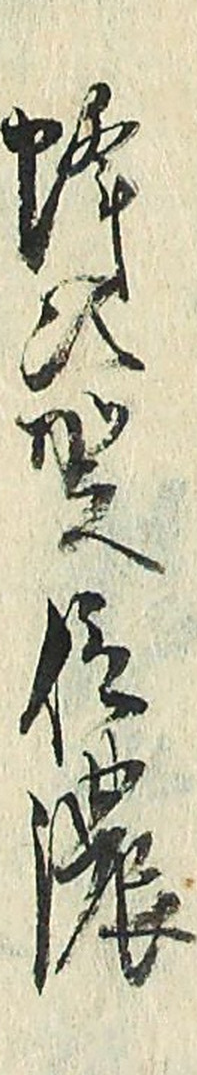蜂須賀信濃
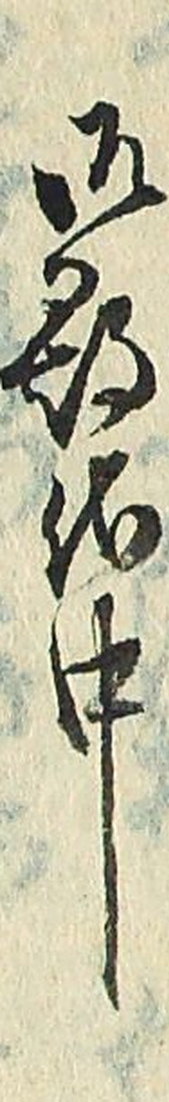御郡代中
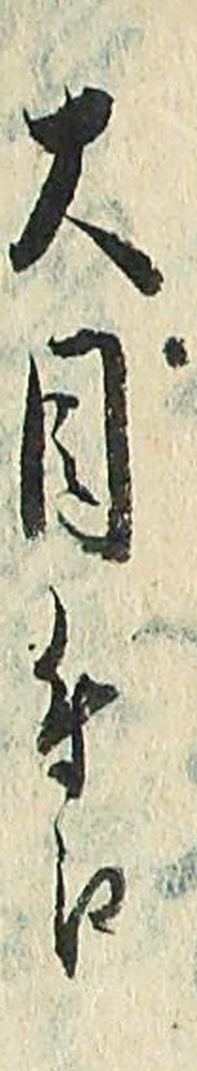大目付江
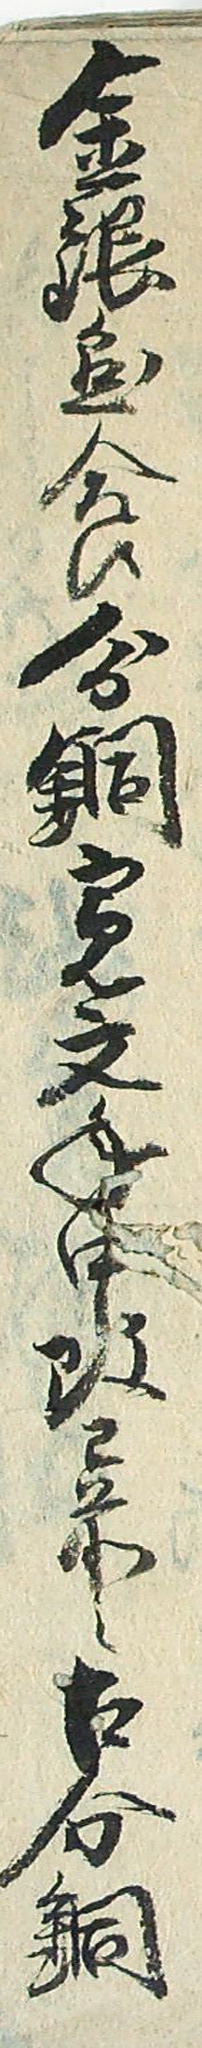金銀懸合候分銅寛文年中改已前之古分銅

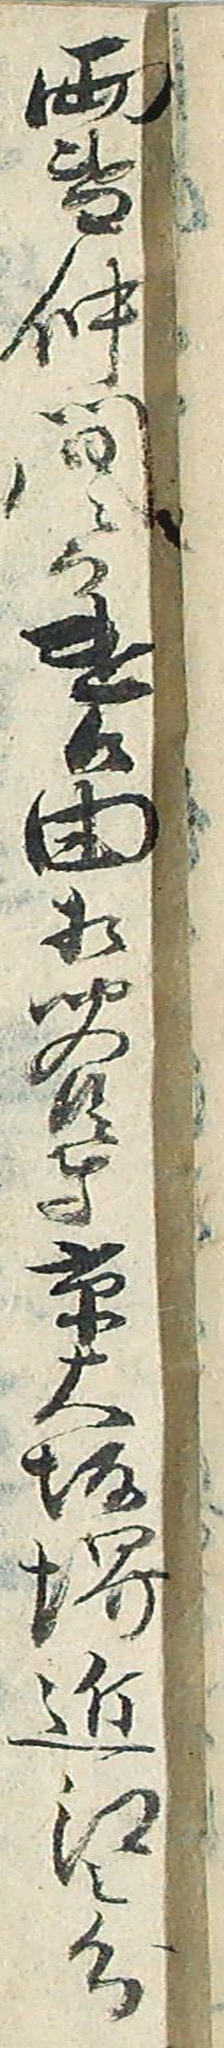両替仲間に而遣候由相聞候に付京大坂堺近江之分
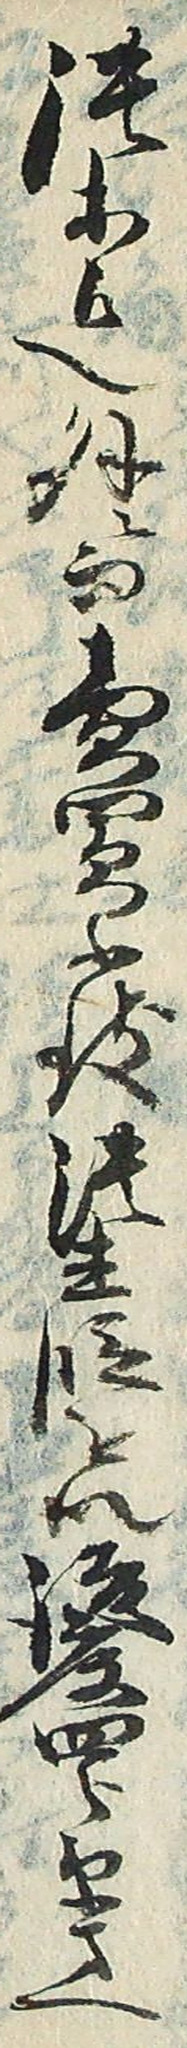潰等迄外に而売買不致潰直段を以後藤四郎兵衛方へ
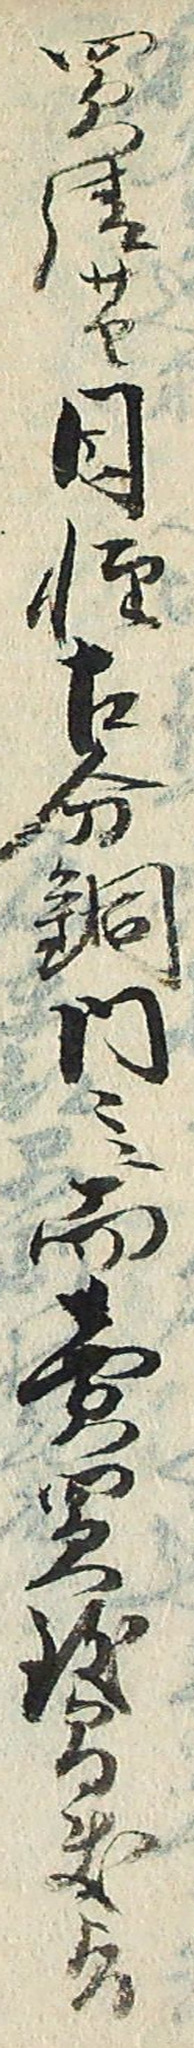買請させ目軽古分銅内々に而売買致間敷旨
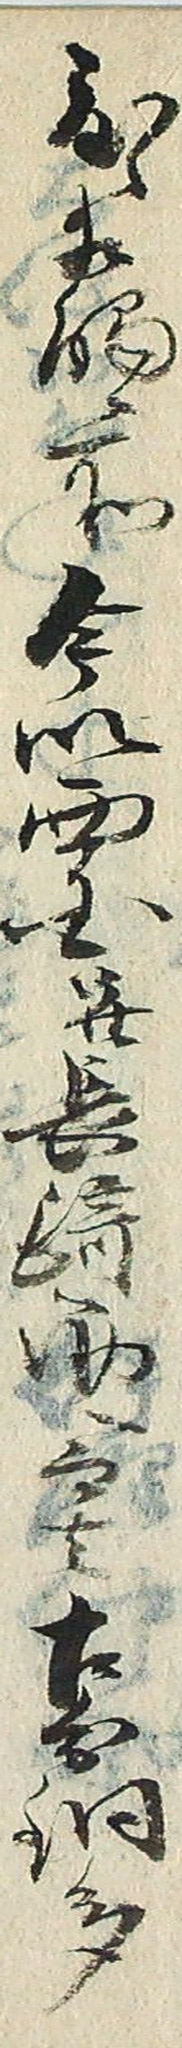度々相触候所今以西国幷長崎筋に而者古分銅多
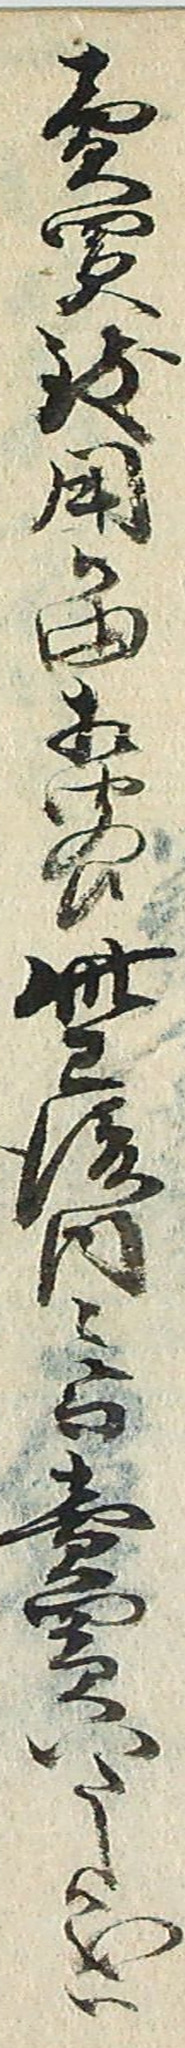売買致用候由相聞候此已後内々に而売買いたし候義は
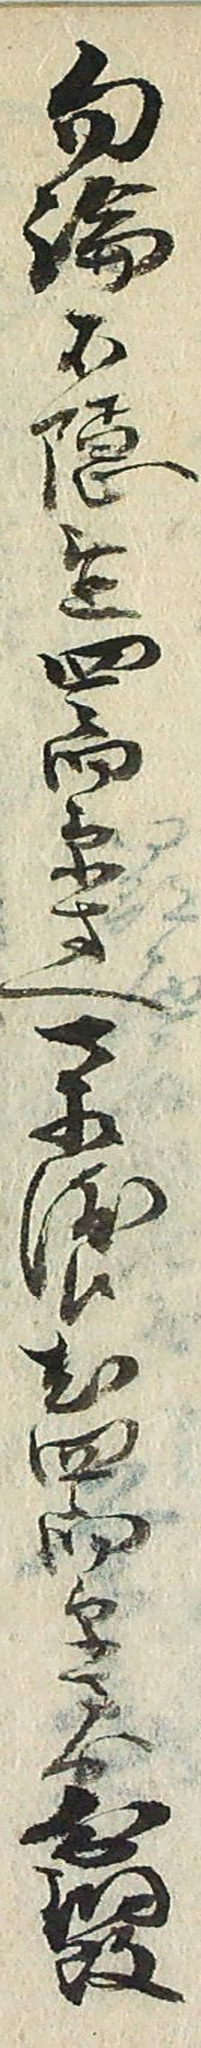勿論不隠置四郎兵衛方へ可相渡候尤四郎兵衛方ゟ分銅改
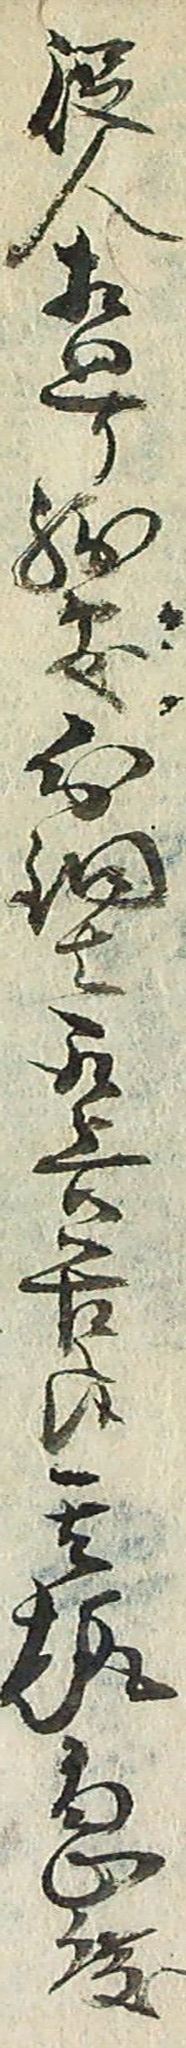役人相廻り紛敷分銅者取上候筈に候其趣急度
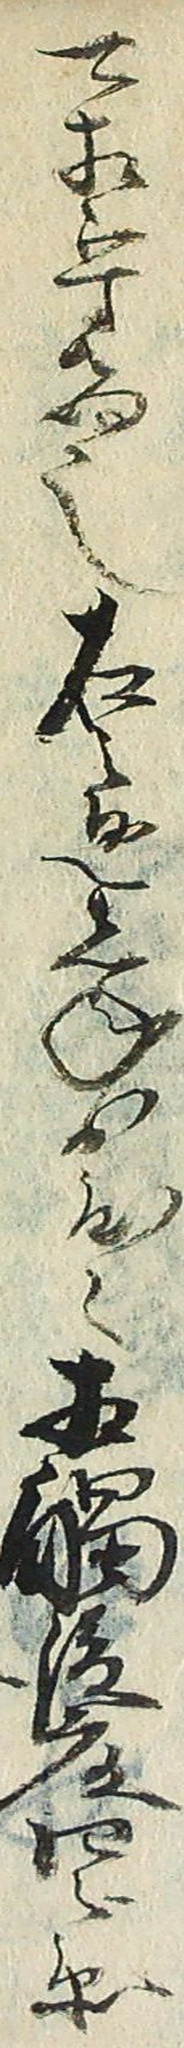可相守者也右之通先年ゟ度々相触後藤四郎兵衛
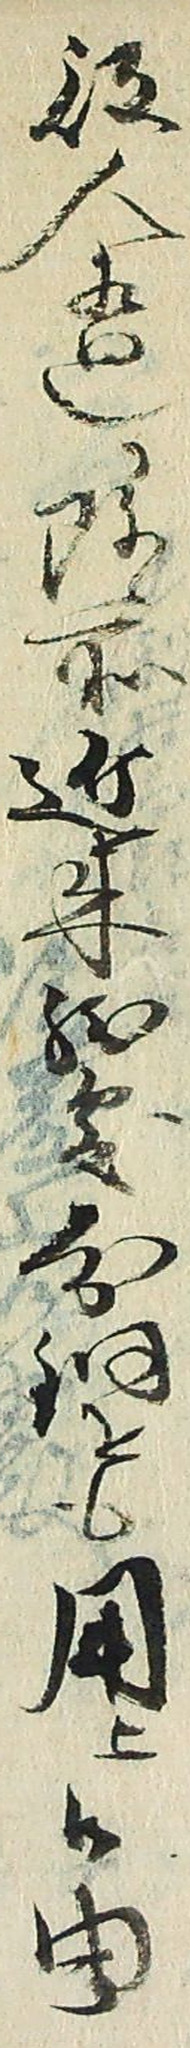役人相廻り改候所近来紛敷分銅をも用ひ候由
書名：諸御用御□受書控
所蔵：鳴門教育大学 Naruto University of Education
